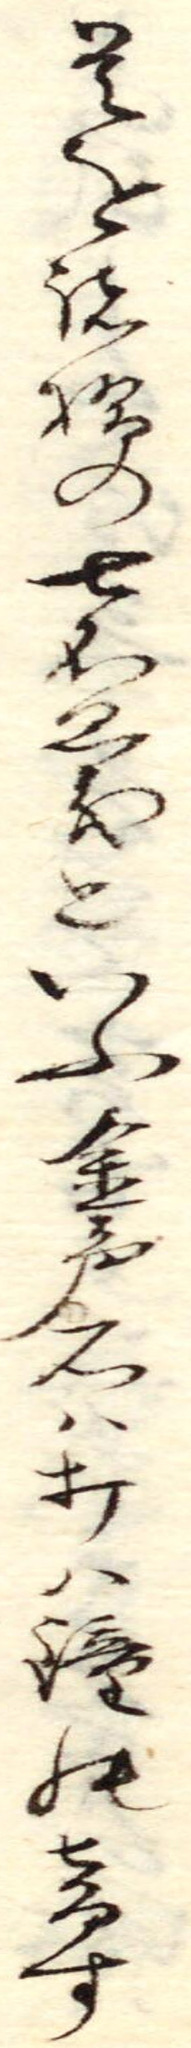是を諸橋の七不思義といふ金声石は打は鐘の音す
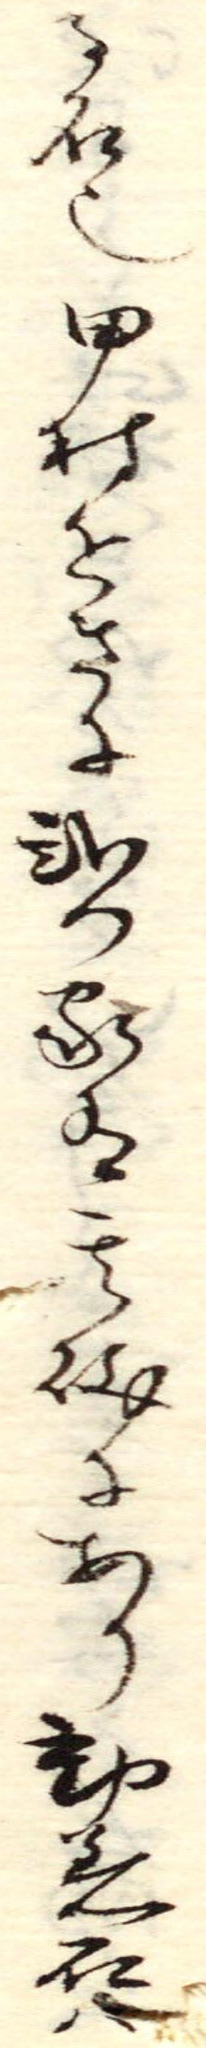る石也甲村近きに弐つ家有其礒にあり動着石は
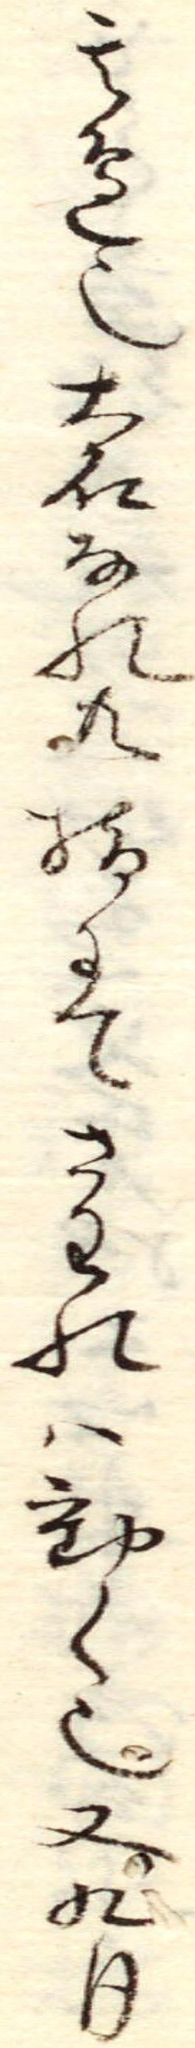其辺也大石なれ共指にてさわれは動く也又九月
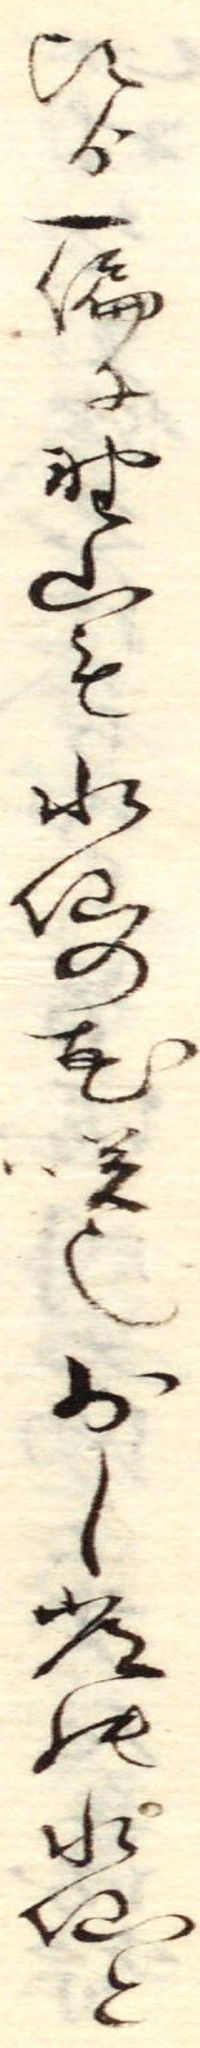頃ゟ一偏に野山も水仙の花咲也少し常の水仙と
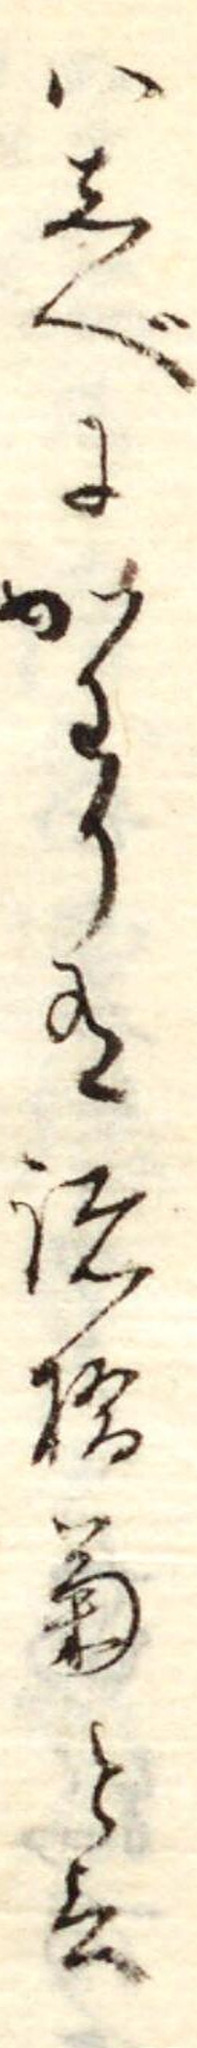はしべにかわり有諸橋菊と言

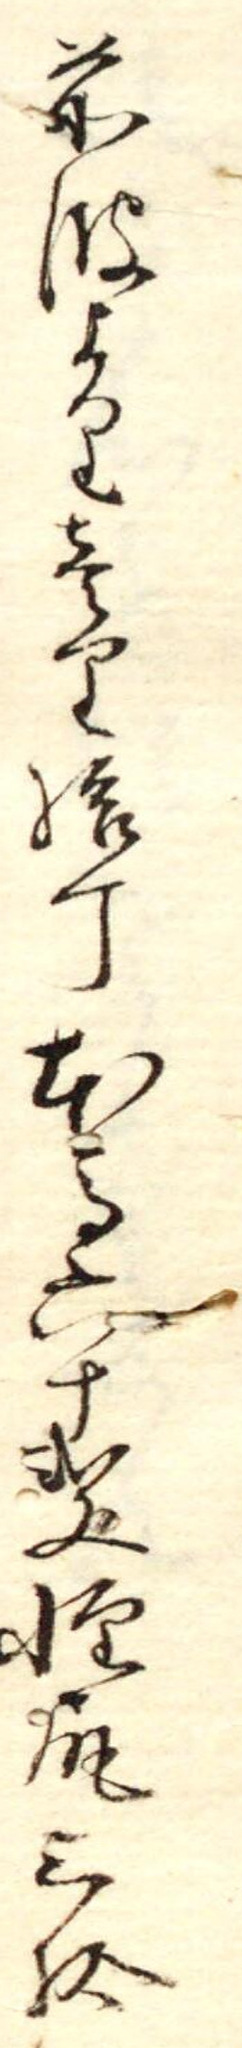前波より壱里拾丁本馬六十弐文軽尻三拾
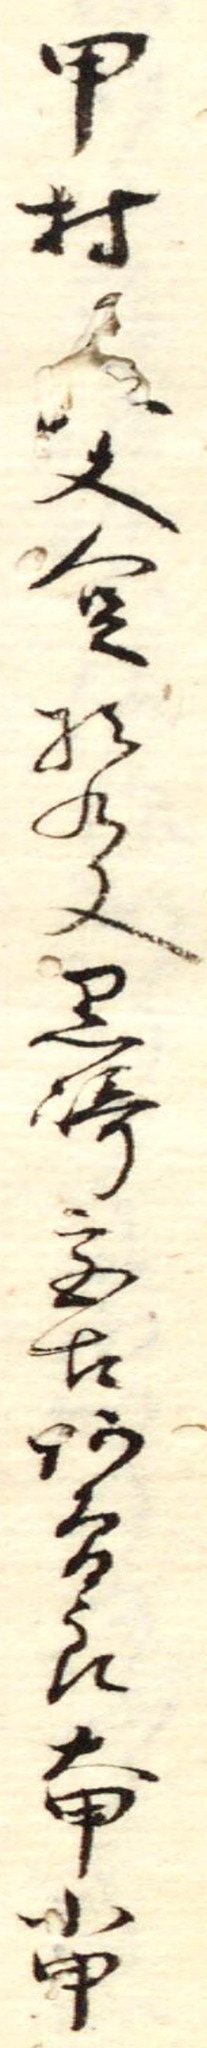甲村八文人足拾九文黒崎宮古阿曽良大甲小甲
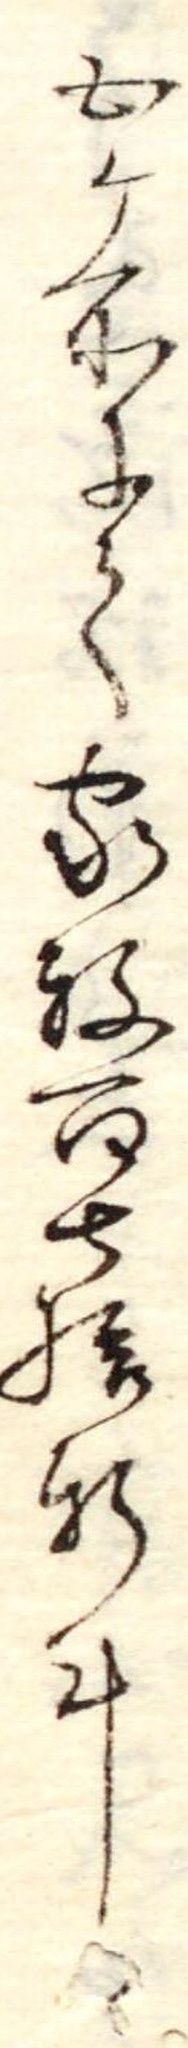五ヶ所にて家数百七拾軒斗
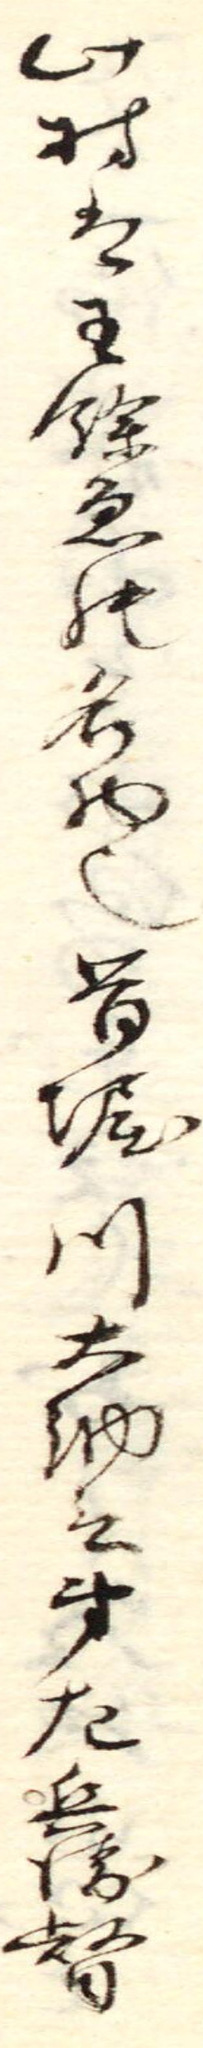此村は王余急の名物也昔堀川大納言弟左兵衛督
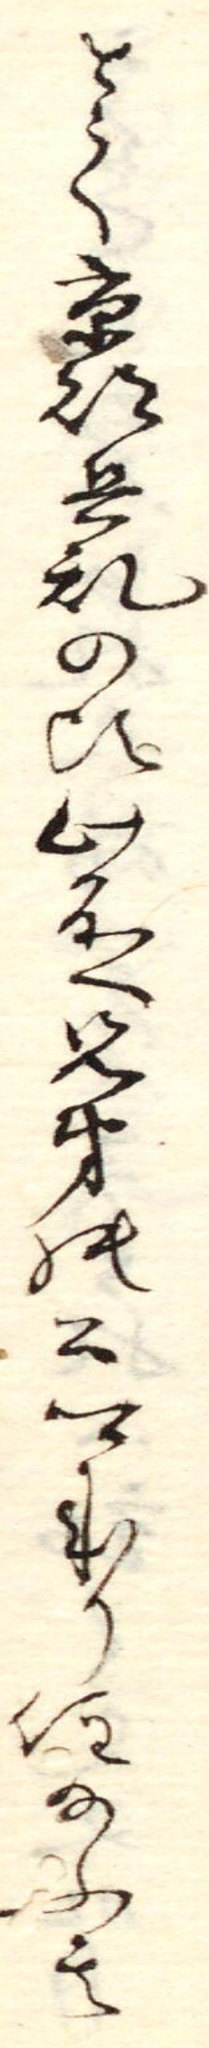とて京都兵乱の頃此所へ兄弟の公郷来り住給ふ其
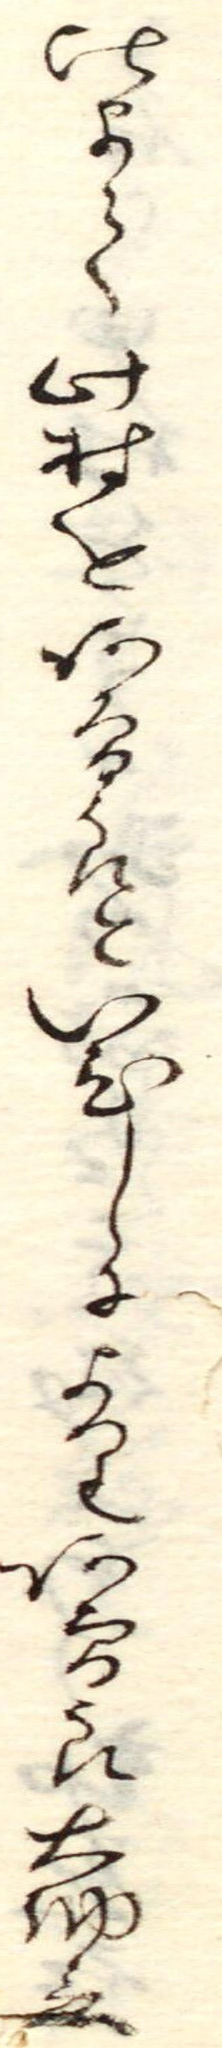頃まて此村を阿曽良といひしにより阿曽良大納言
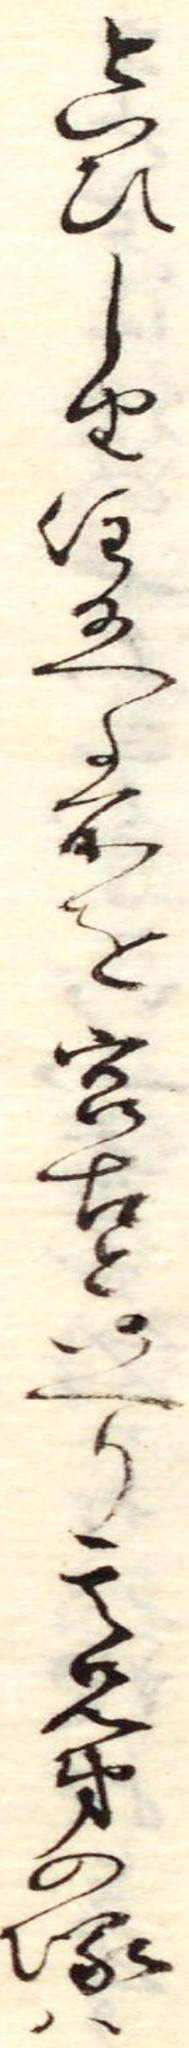といひし由住給へる所を宮古といへり其兄弟の塚は
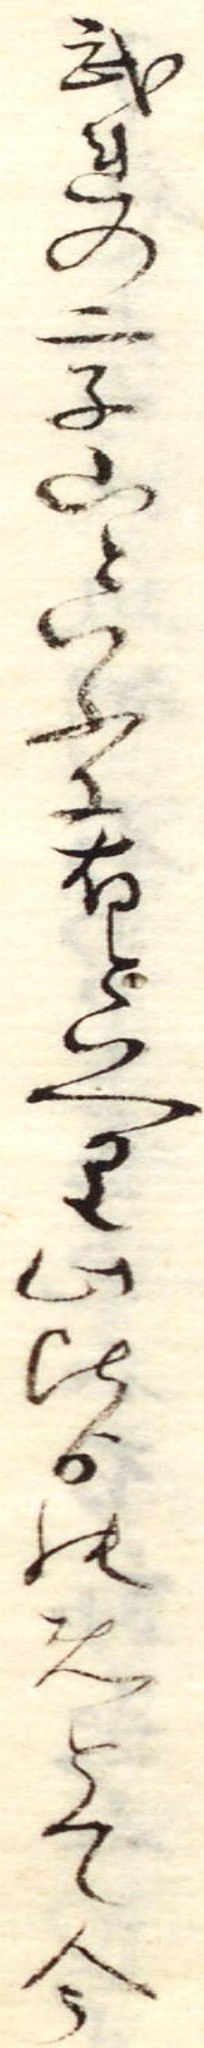武連の二子山といふに有といへり此比ゟの者とて今
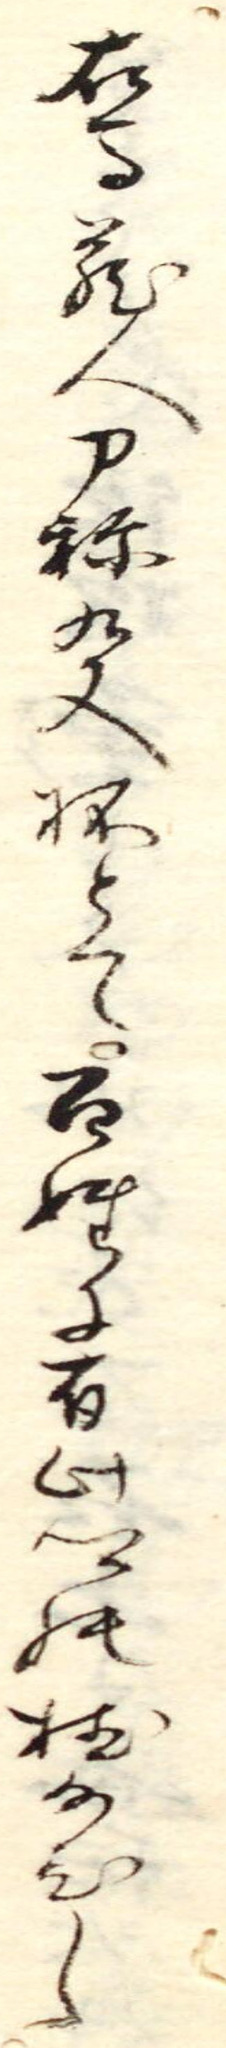右馬蔵人刀祢九文抔とて百姓に有此郷の植給ひし
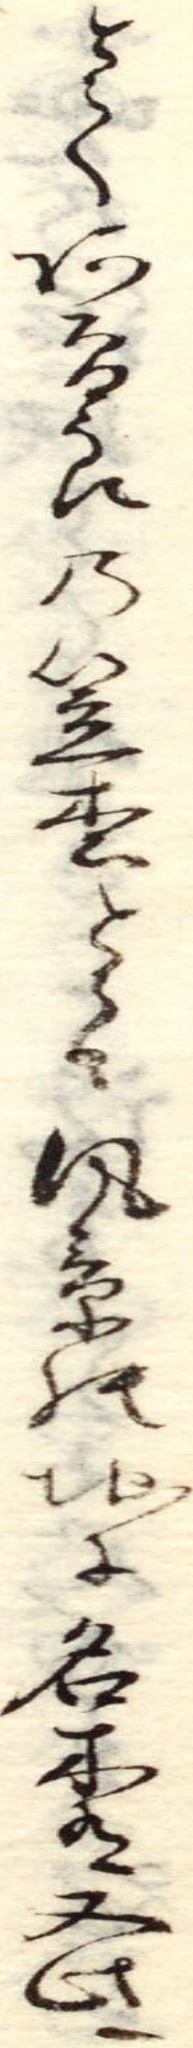とて阿曽良の笠松枩とて風景の地に名木有又此
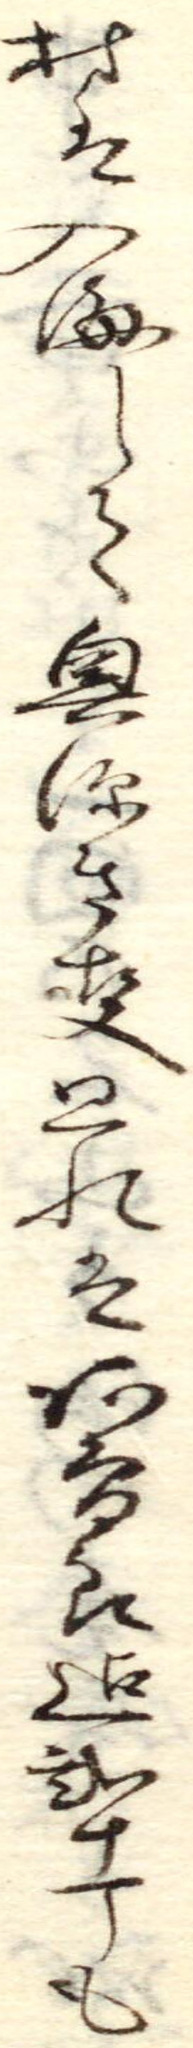村は入海して奥深き事廻れは阿曽良迄弐十丁も
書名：能登名跡誌
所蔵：Ishikawa Prefectural Library
